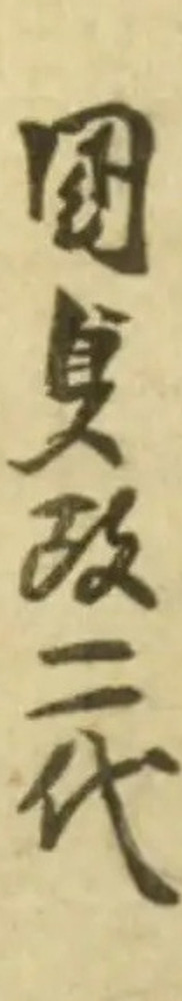国貞改二代
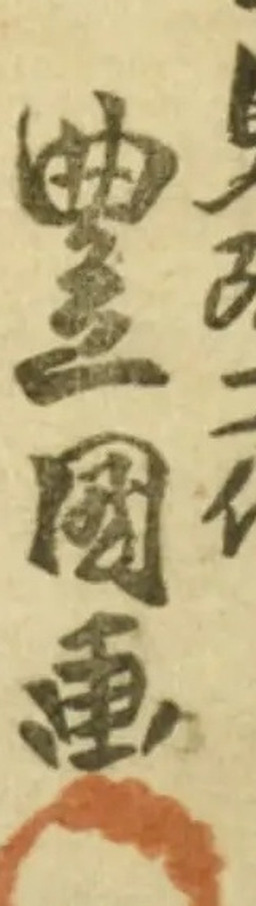豊国画○
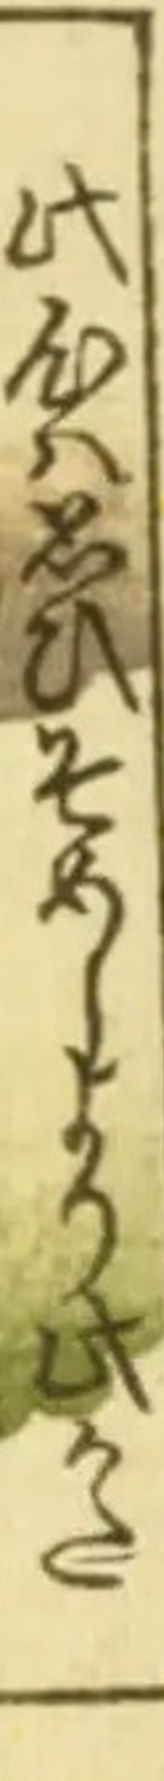此心は思ひそめしより此かた
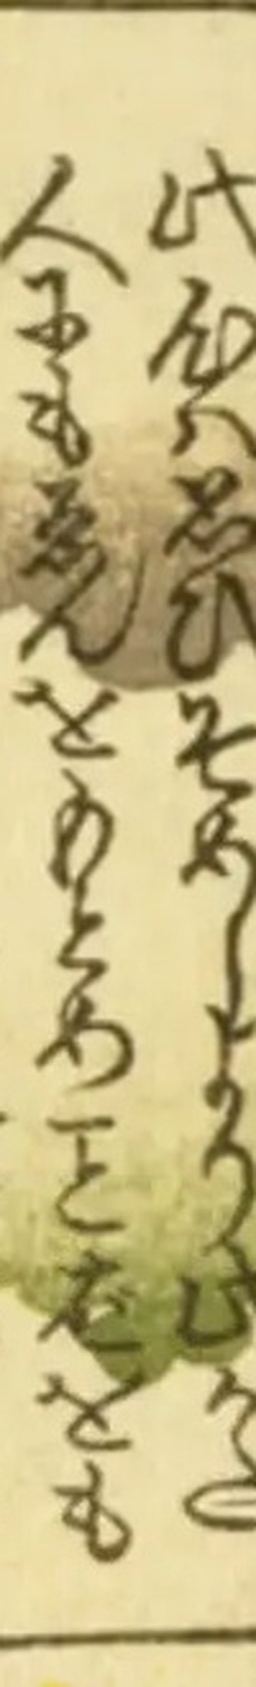人にもゑんをもとめことばをも
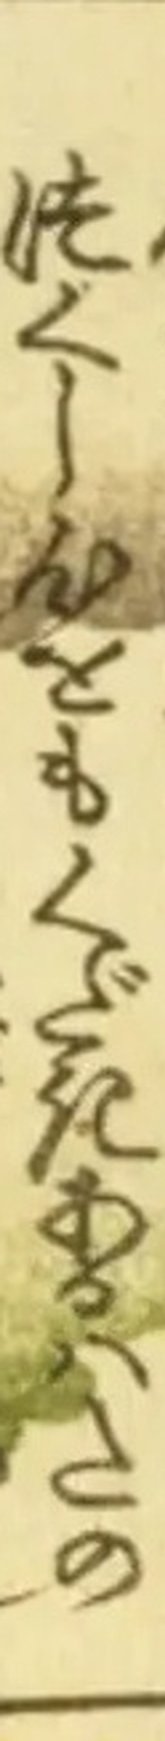つくし心をもくだきあるはたの
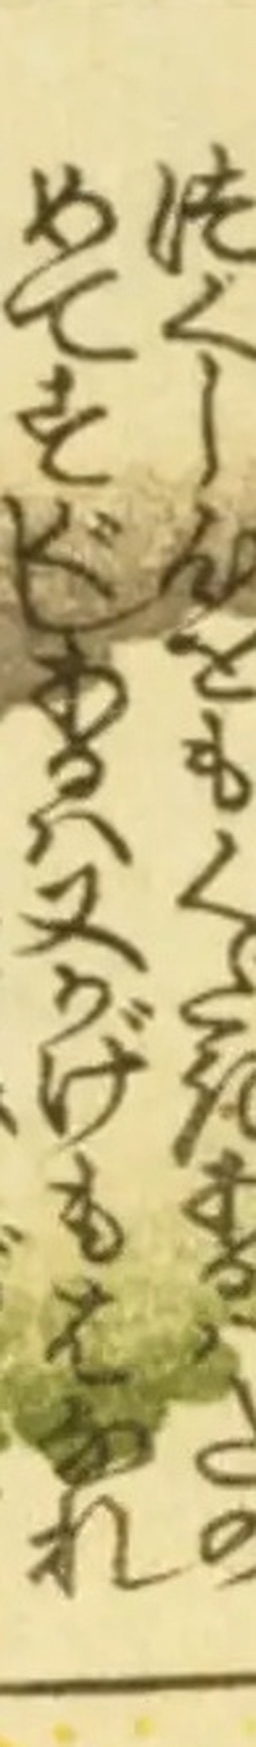めてすぐしあるは又かげもはなれ
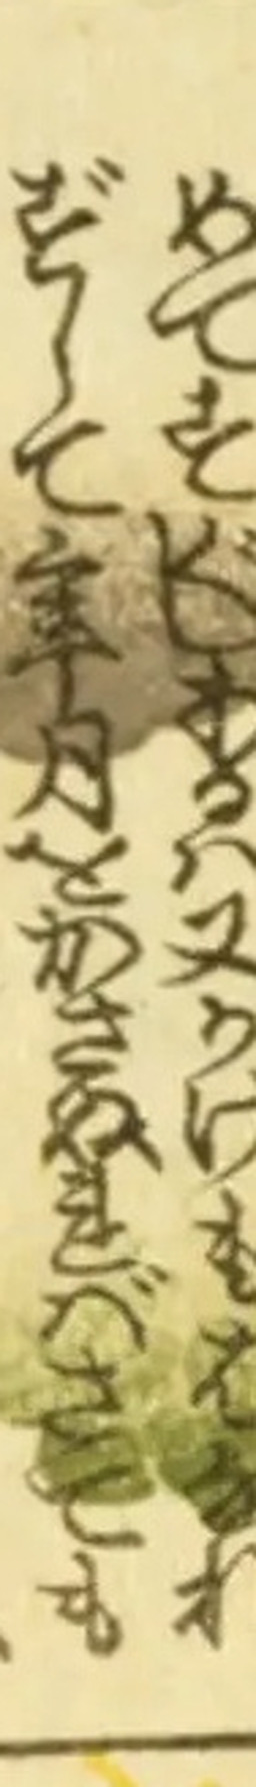ずして年月をかさぬればさても
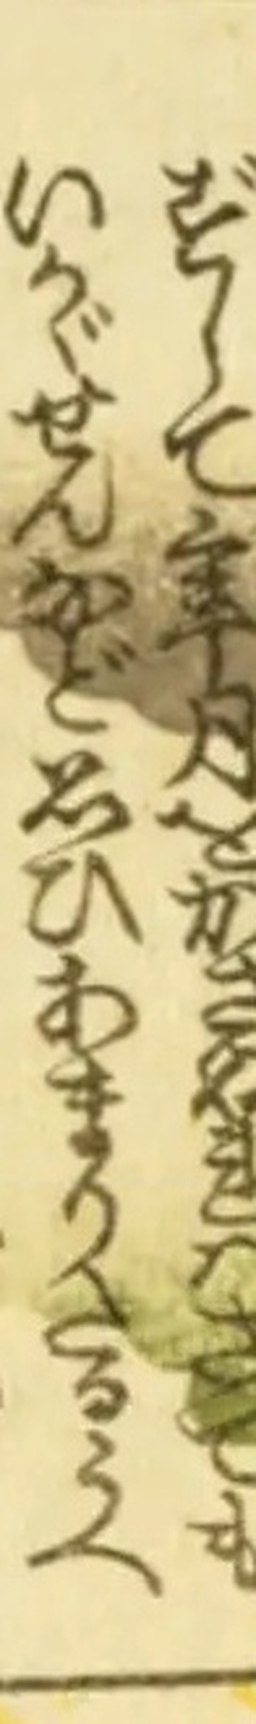いかゞせんなど思ひあまりたるうへ
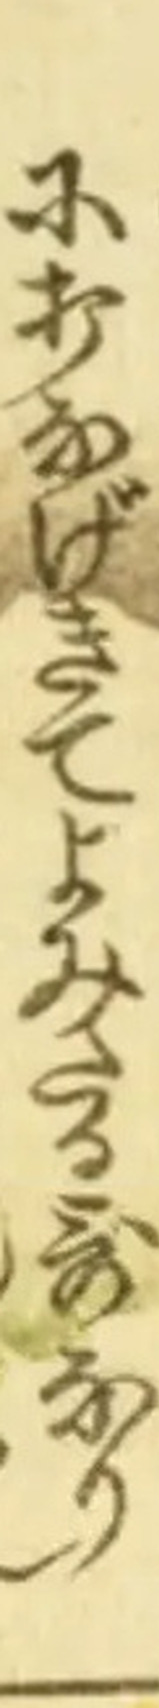に打なげきてよみたる歌なり
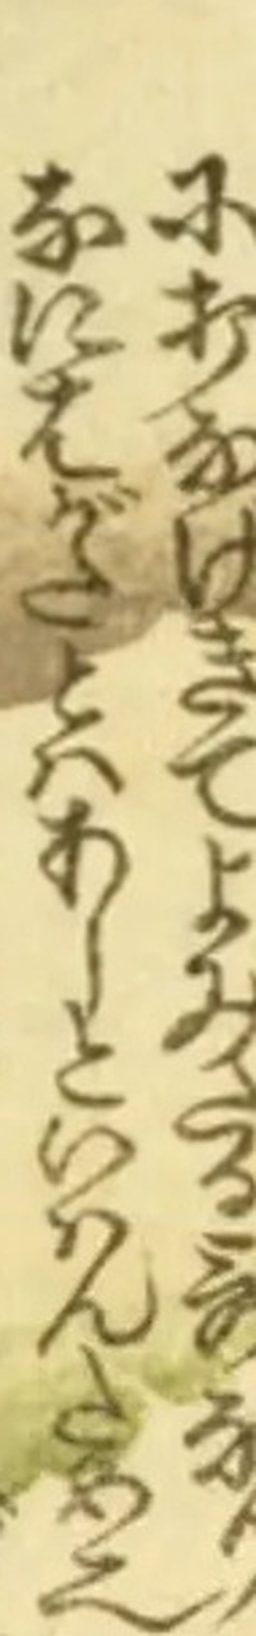なにはがたとはあしといはんため也
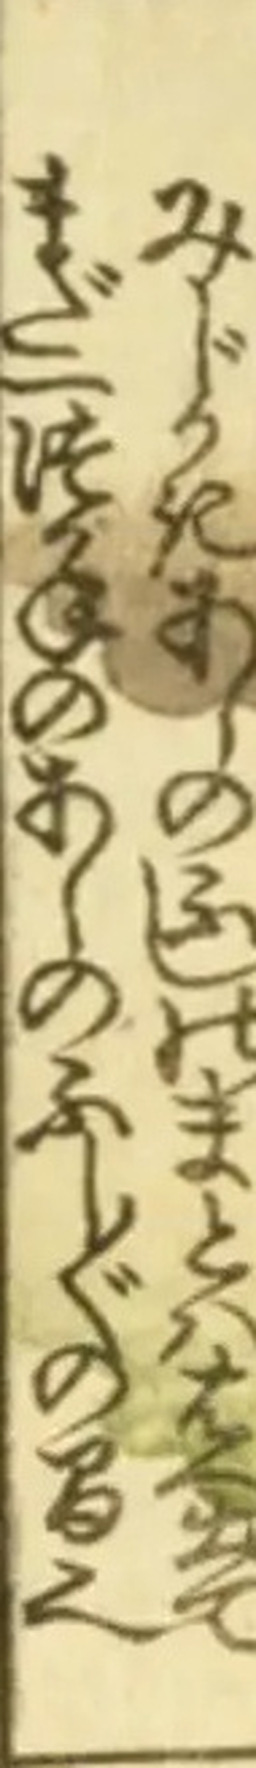まだ一つかねのあしのふし〴〵の間也
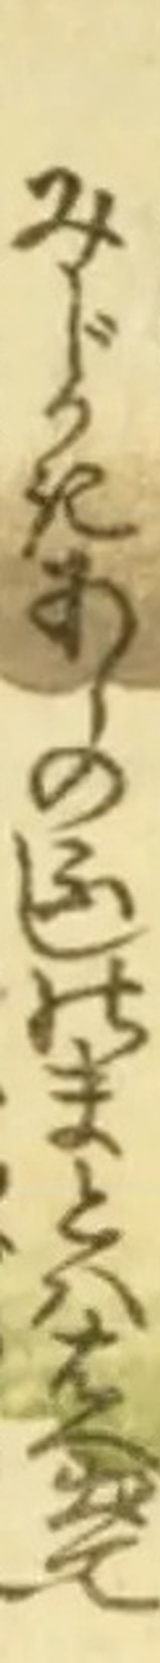みじかきあしのふしのまとははへ出て
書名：百人一首絵抄　十九　伊勢
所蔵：国立国会図書館 National Diet Library, JAPAN
